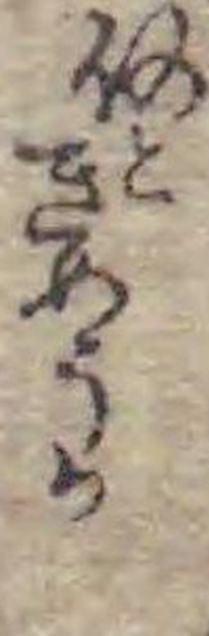きめうか
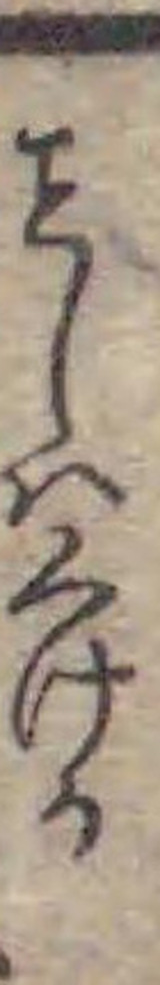ことしはくけか
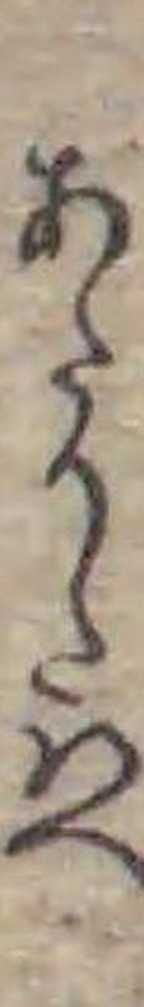あたりたはへ
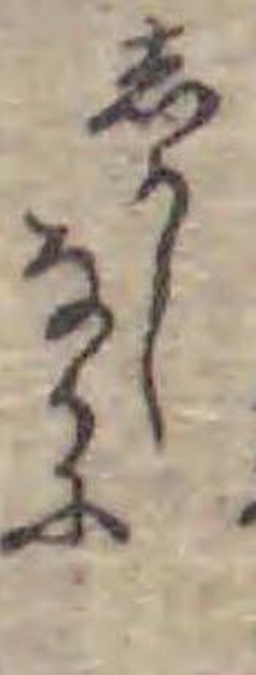なかに
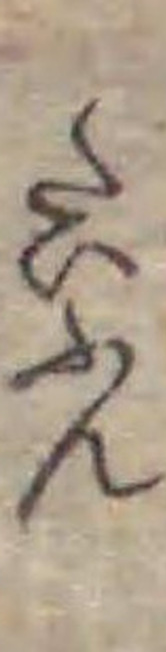たいふん
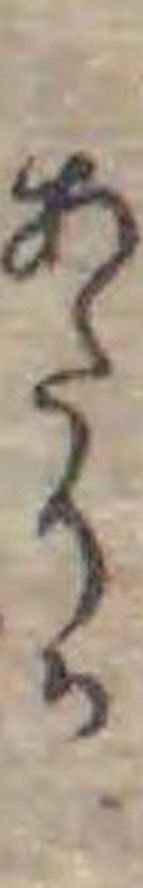あたりか
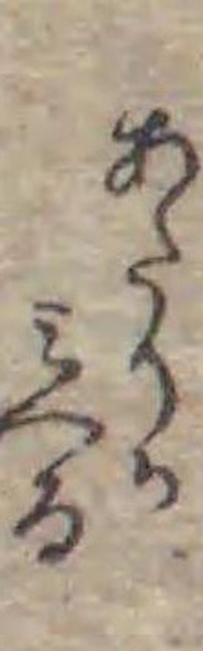みへる
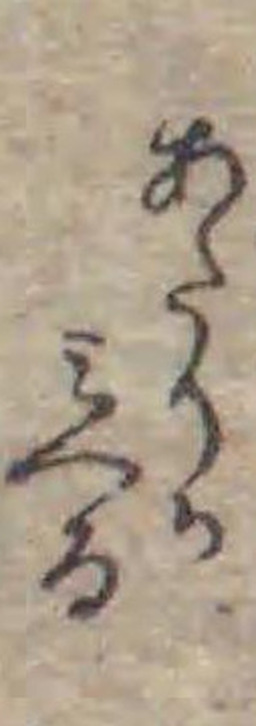みへる
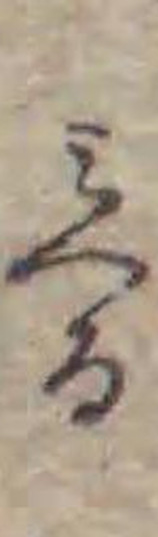みへる

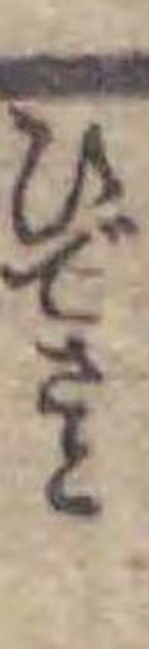ひでさと
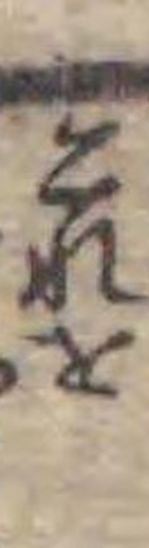これを
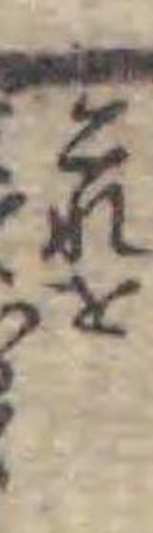これを
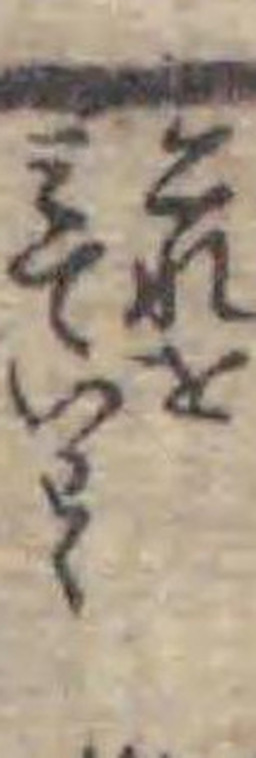みていわく
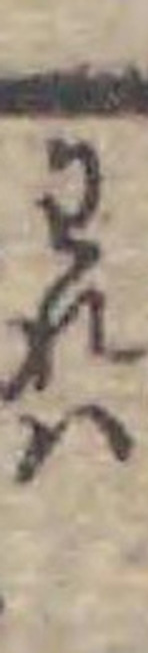われは
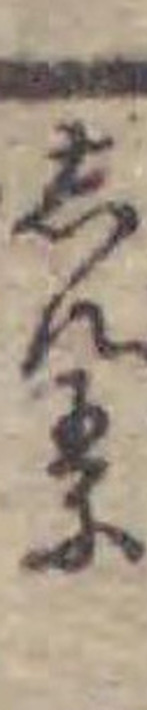しん王に
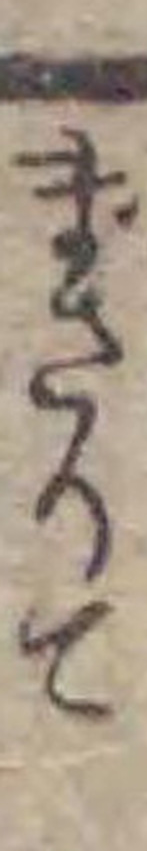まさりて
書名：時代世話二挺皷 : 2巻
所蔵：国立国会図書館 National Diet Library, JAPAN
